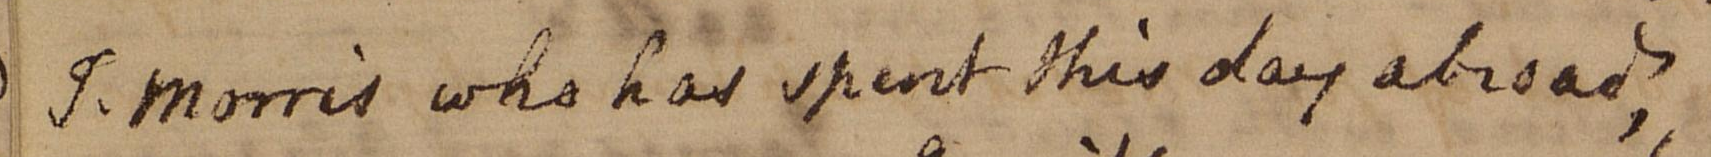T. Morris who has spent this day abroad,
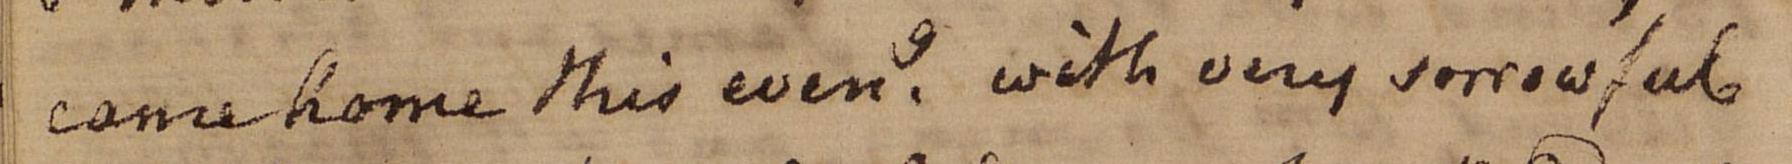came home this even^g. with very sorrowful
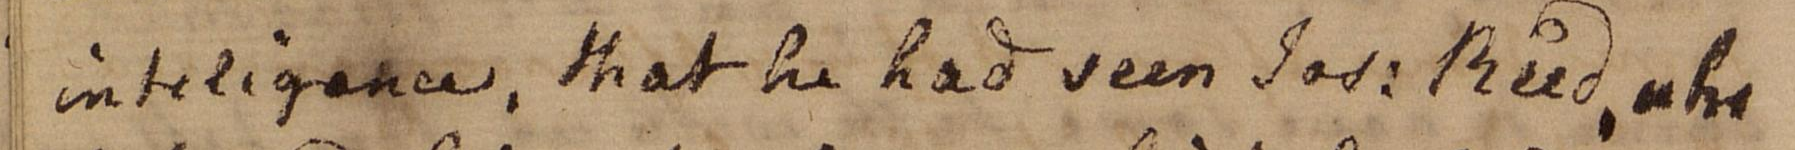inteligence, that he had seen Jos: Reed, who
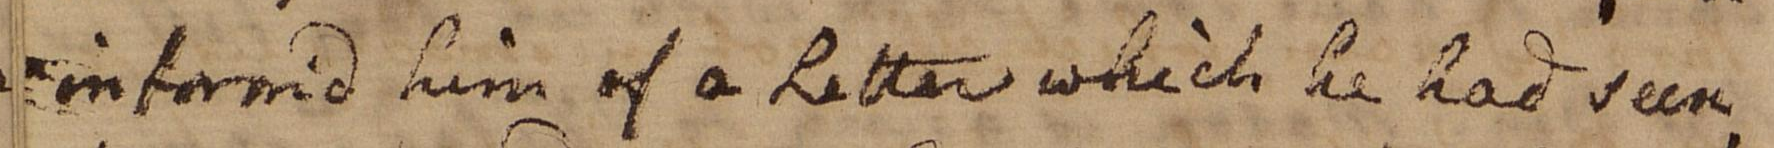inform'd him of a Letter which he had seen,
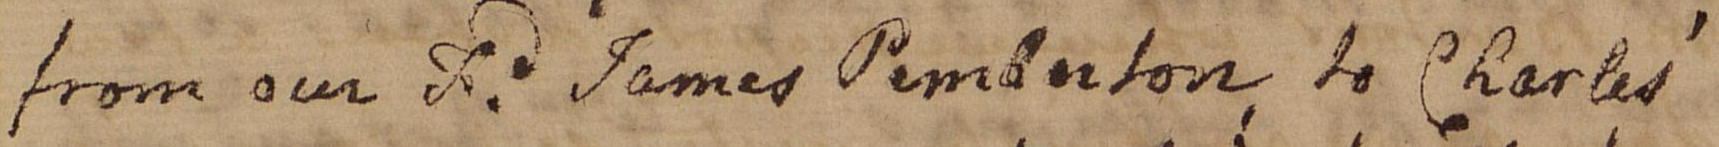from our F^d. James Pemberton, to Charles'
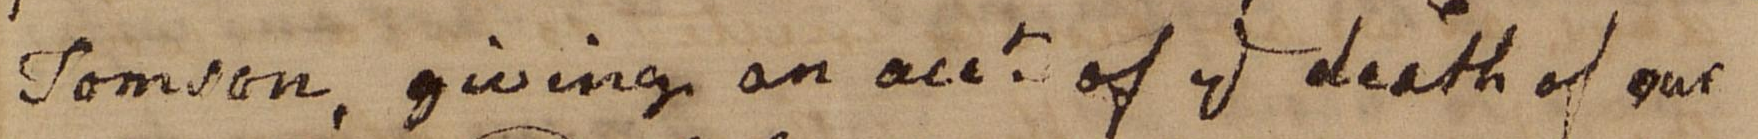Tomson, giving an acc^t. of y^e death of our
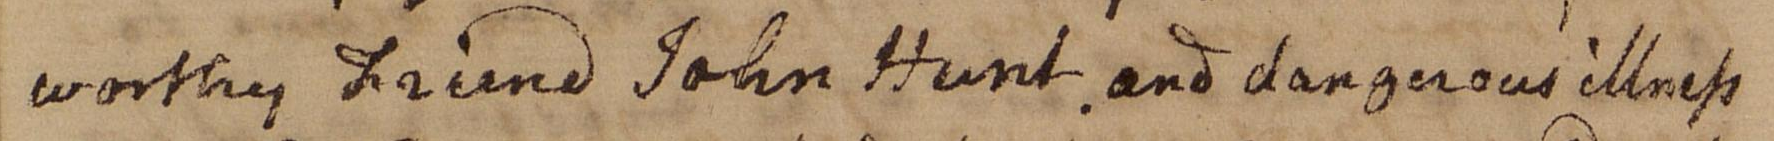worthy Friend John Hunt, and dangerous illness
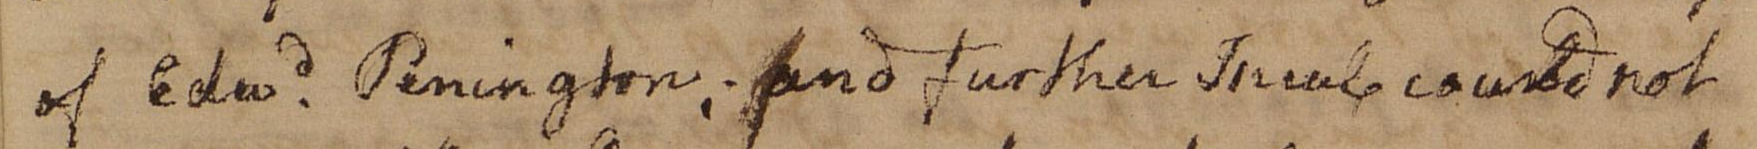of Edw^d. Penington, and further Isreal could not
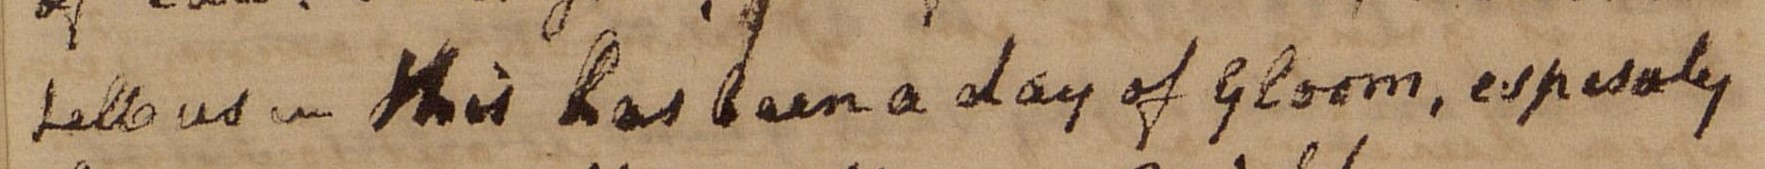tell us- that has been a day of Gloom, expressly
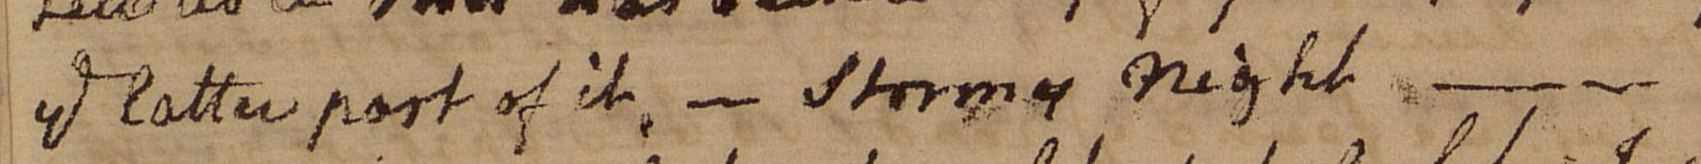y^e latter part of it,- Stormy night-
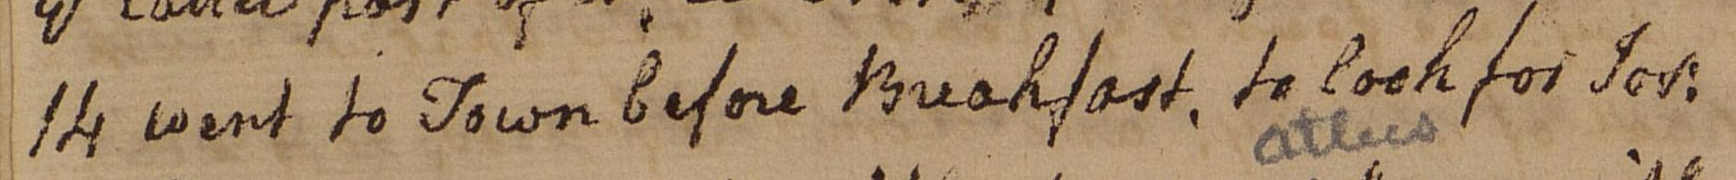14 went to Town before Breakfast, to look for Jos:
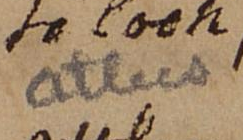Atlees
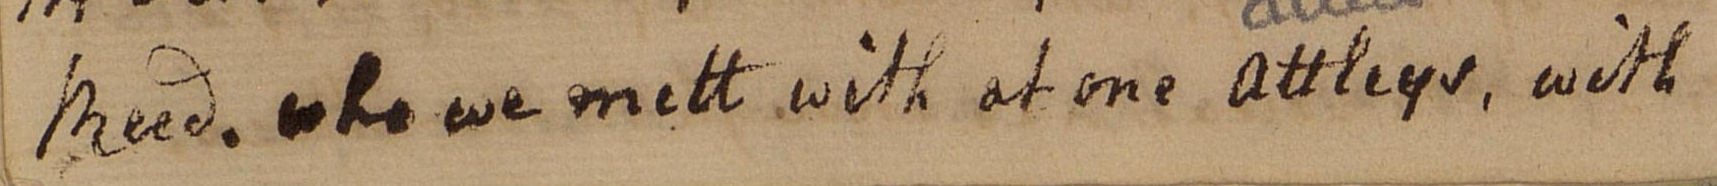Reed. who we mett with at one Attleys, with
